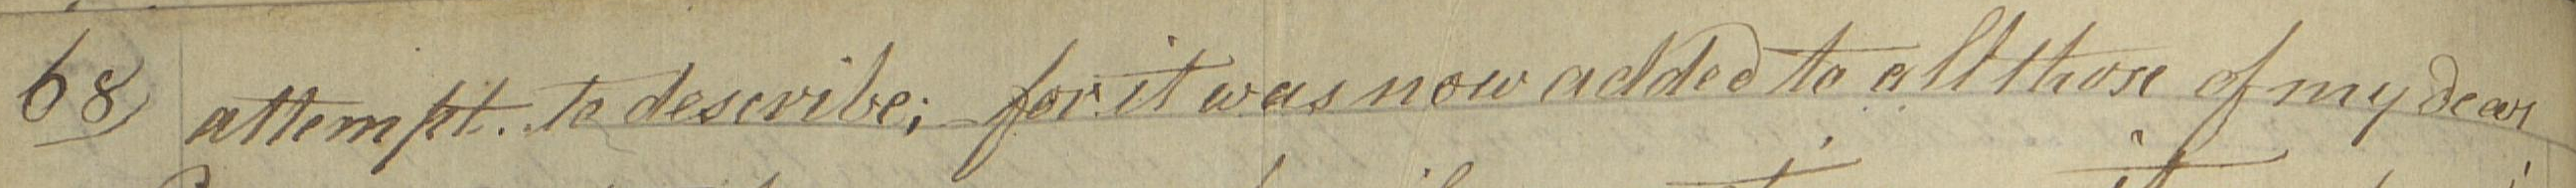68 attempts to describe; for it was now added to all those of my dear
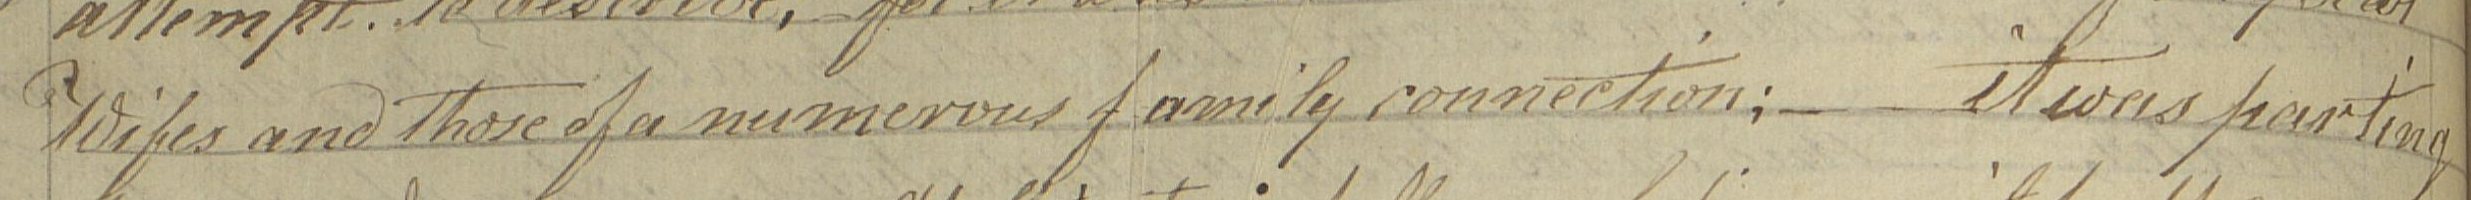Wifes and those of a numerous family connection; it was parting
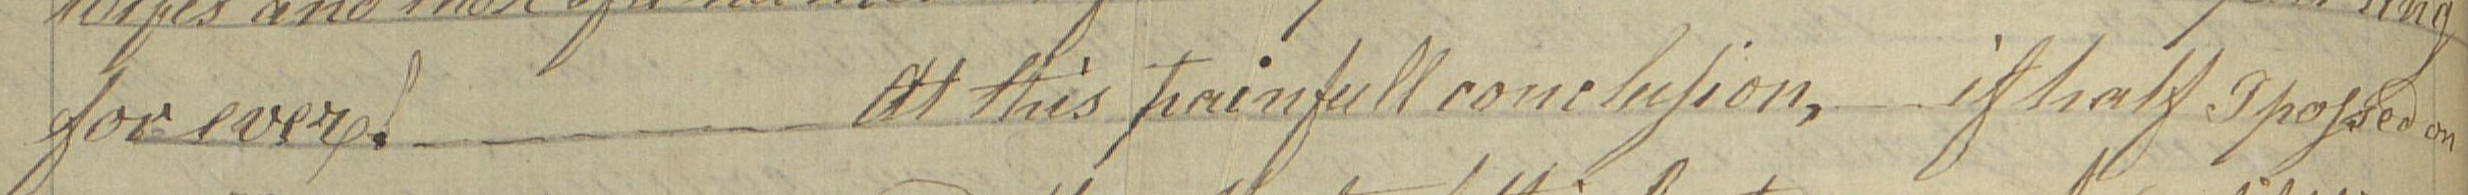for ever. At this painfull conclusion, if half I possed on
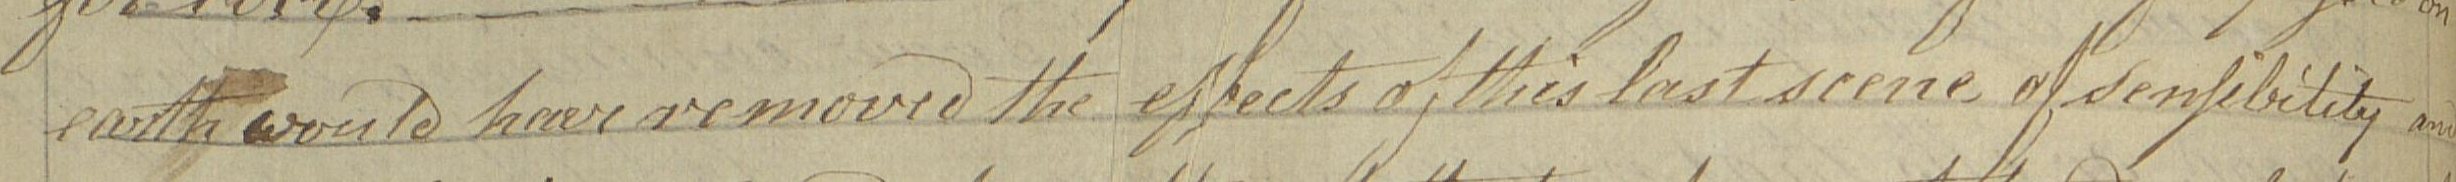earth would have removed the effects of this last scene of sensibility.
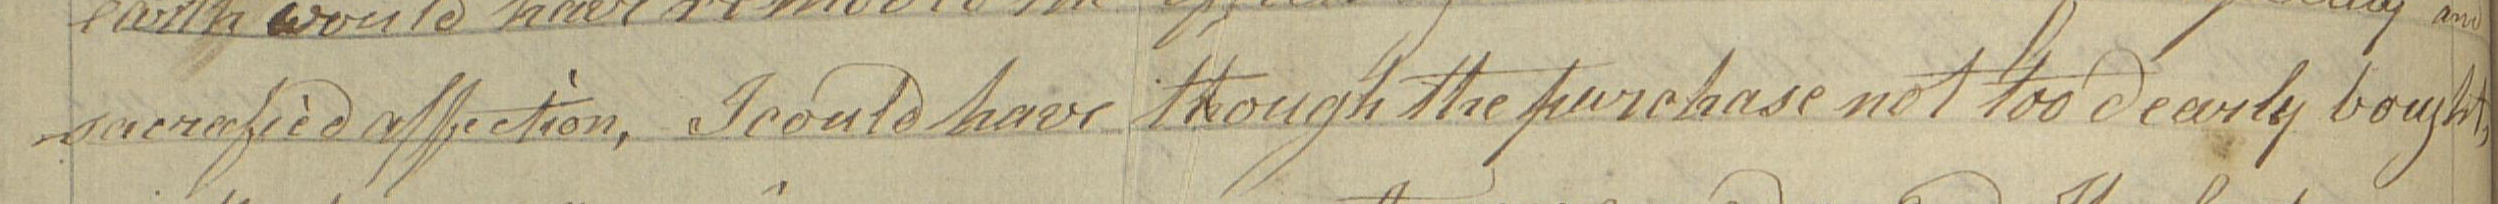sacrafied affection, I could have though the purchase not too dearly bought
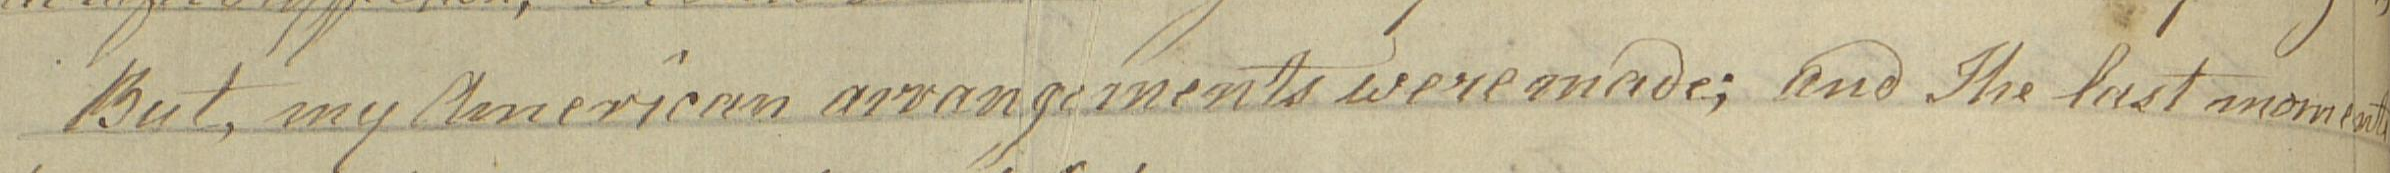But, my American arrangements were made; and The last moments
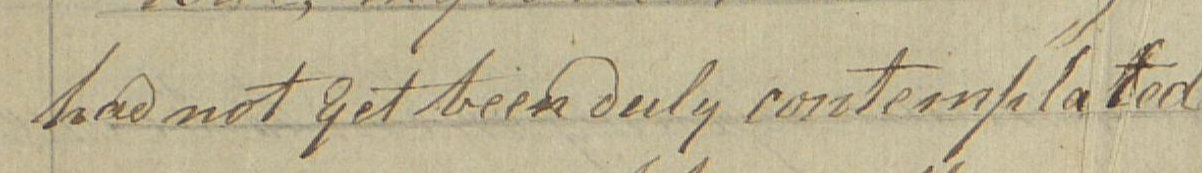had not yet been duly contemplated.
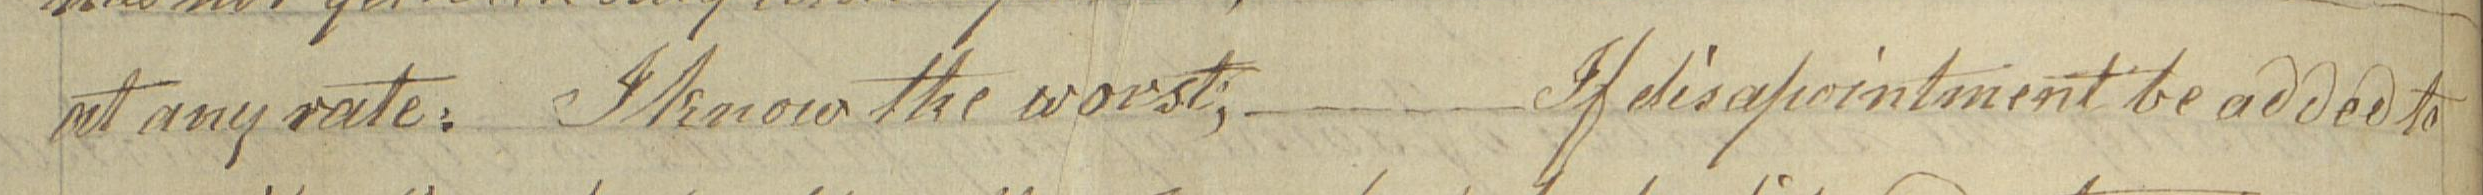at any rate: I know the worst; If disapointment be added to
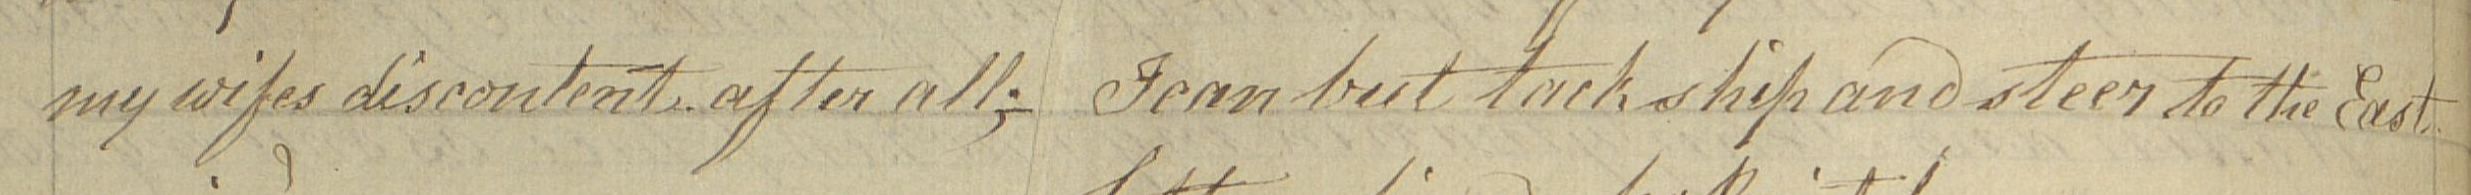my wifes discontent after all; I can but tack ship and steer to the East
